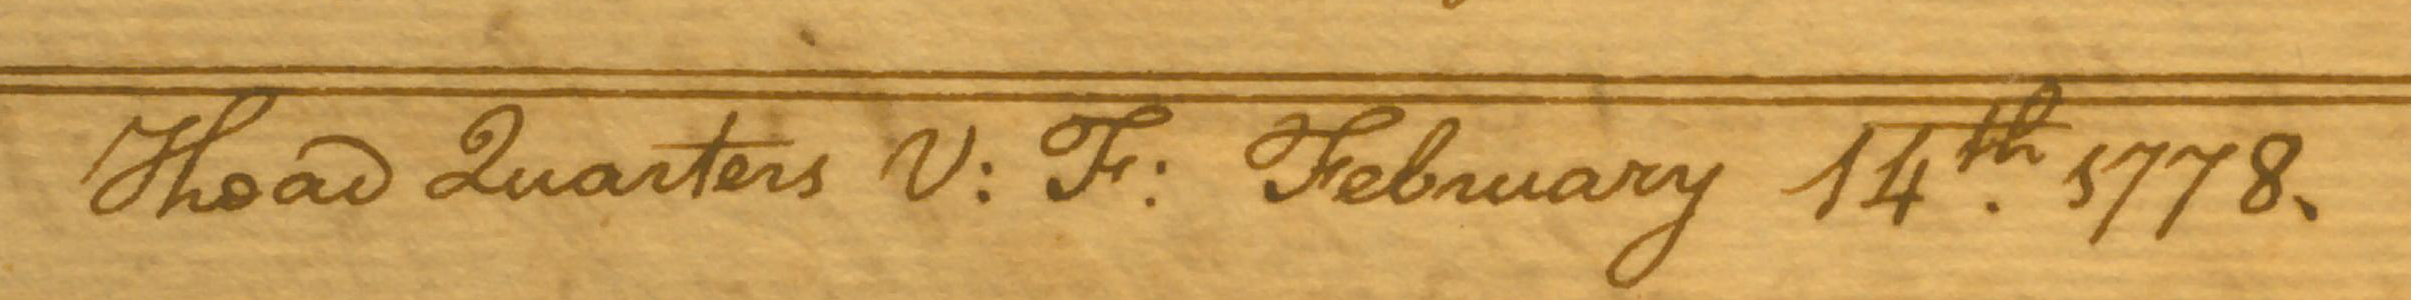Head Quarters V: F: February 14^th. 1778.
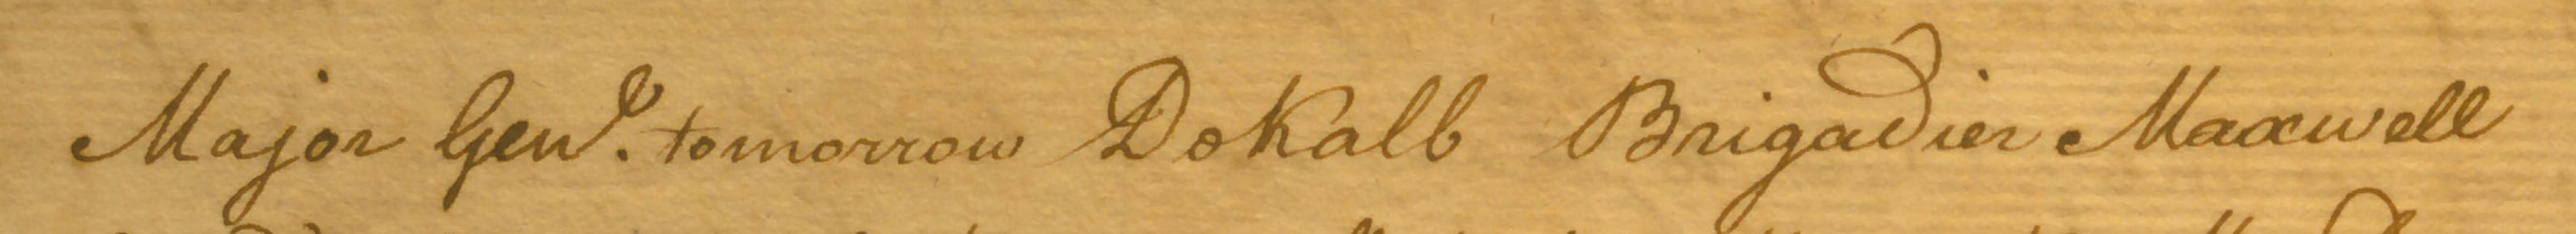Major Gen^l. tomorrow DeKalb Brigadier Maxwell
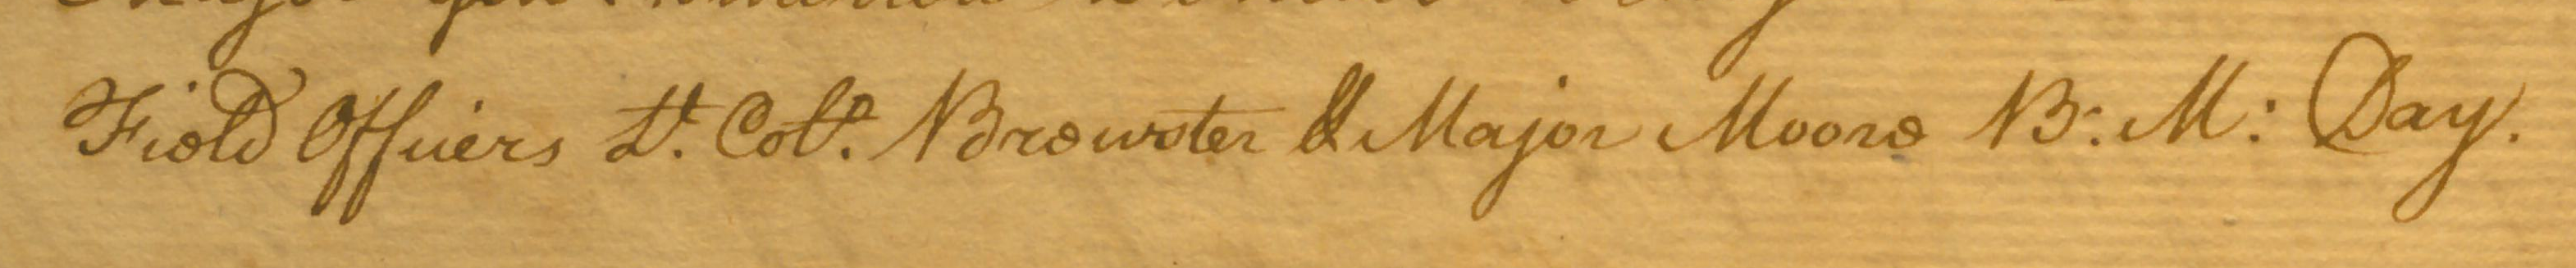Field Officers L^t. Col^o. Brewster & Major Moore B: M: Day.
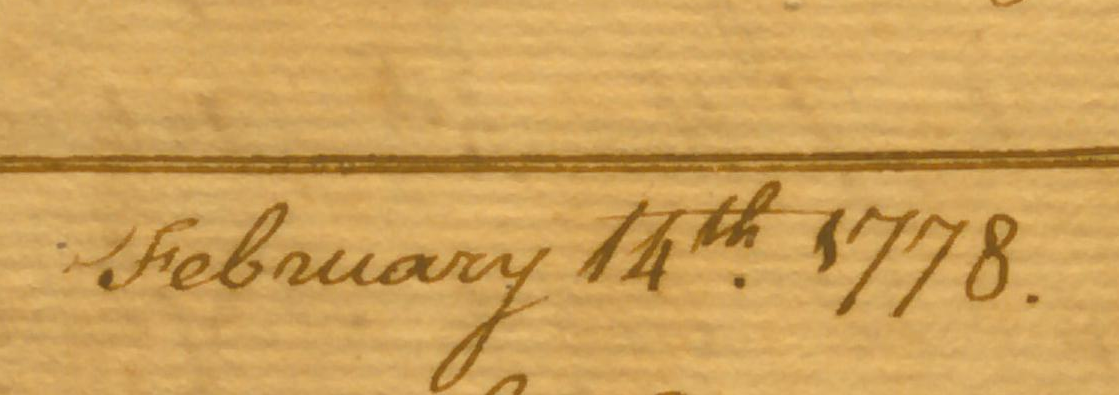February 14^th. 1778.
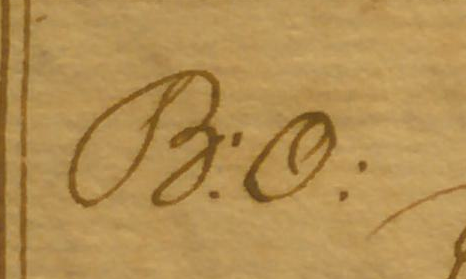B: O:
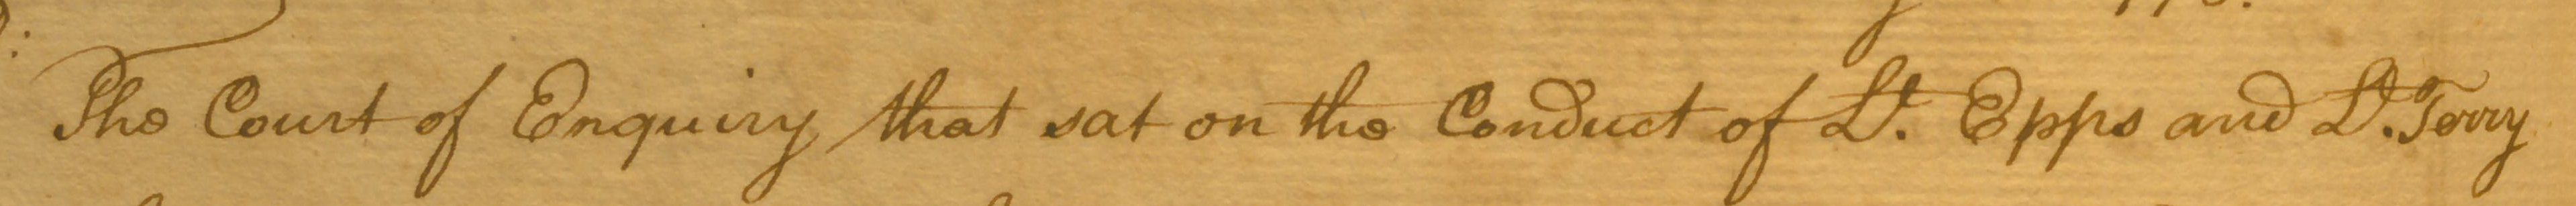The Court of Enquiry that sat on the Conduct of L^t. Epps and D Terry
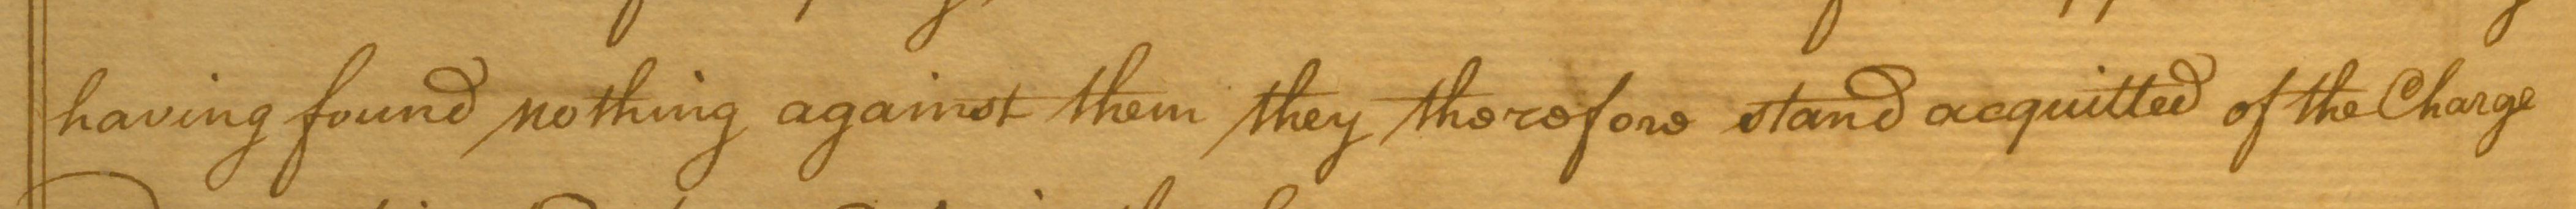having found nothing against them they therefore stand acquitted of the Charge
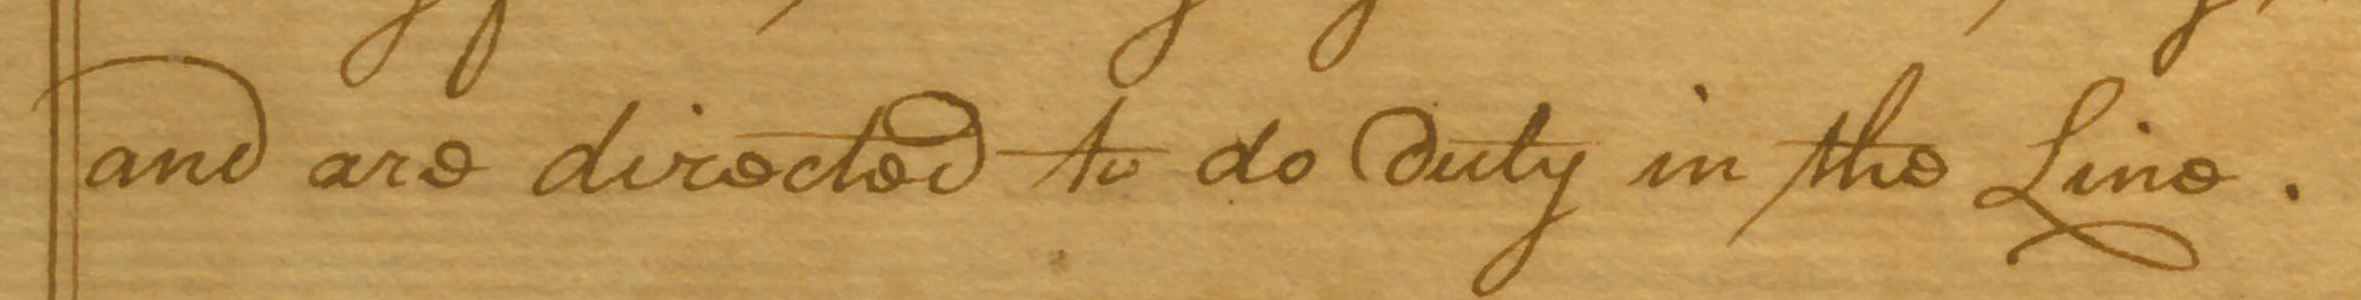and are directed to do duty in the Line.
